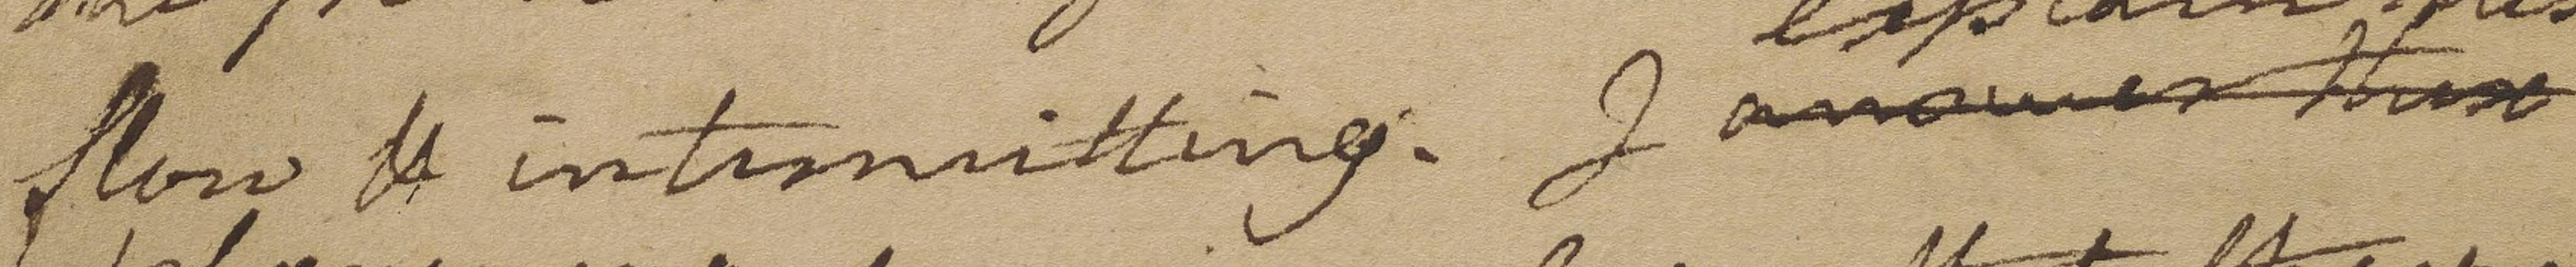slow& intermitting. I [answer]
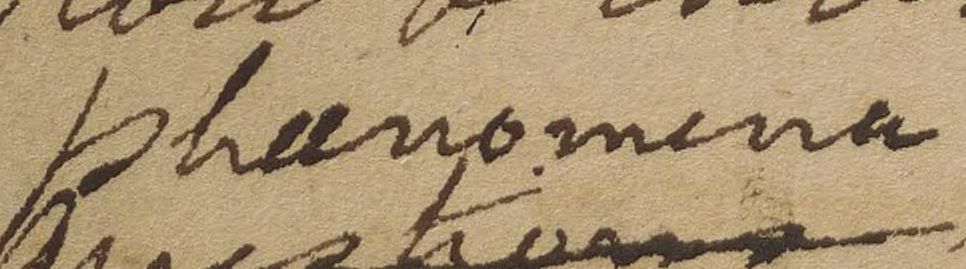phenomena
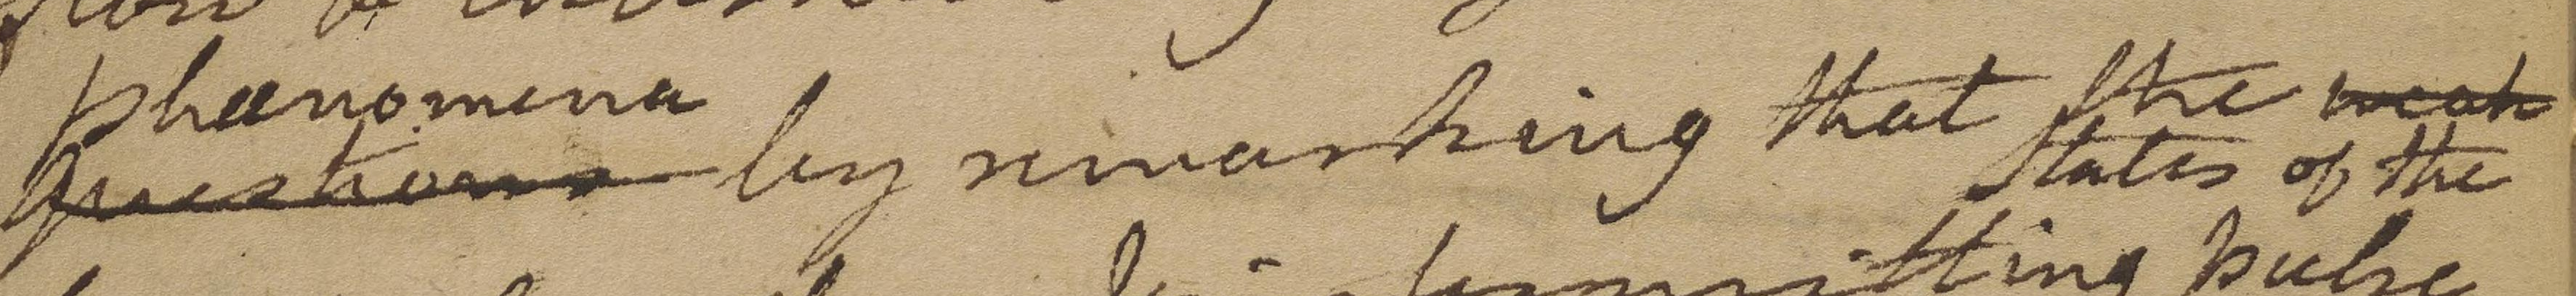[questions] by remarking that the [weak]
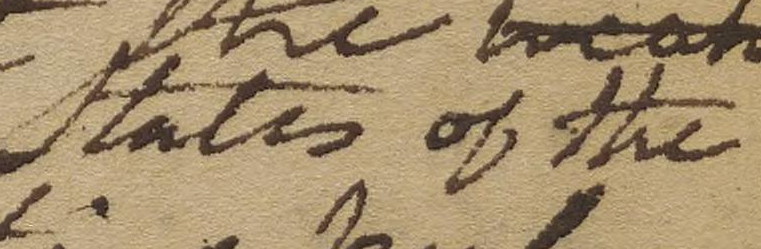states of the
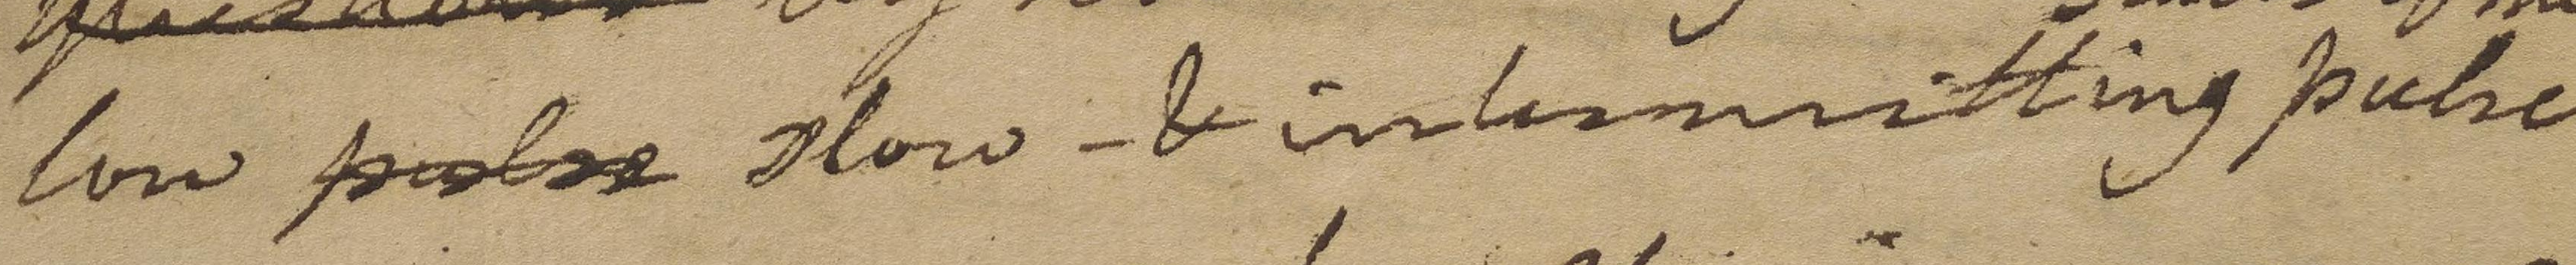low [pulse] slow- & intermitting pulse
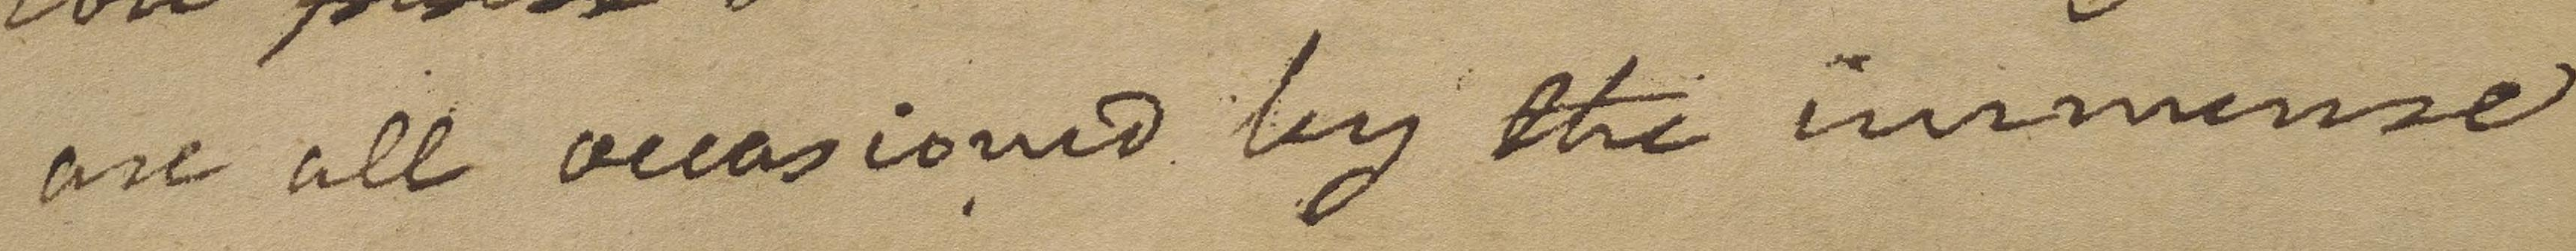are all occasioned by the immense
